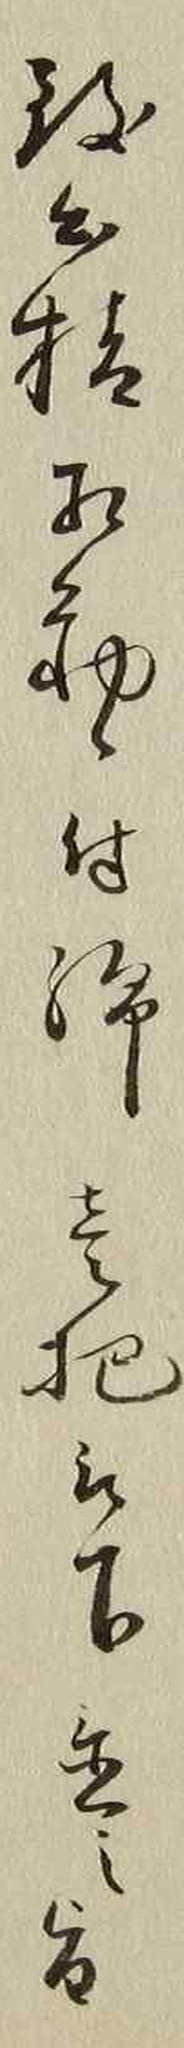致出精相勤候付綿壱把被下置之旨
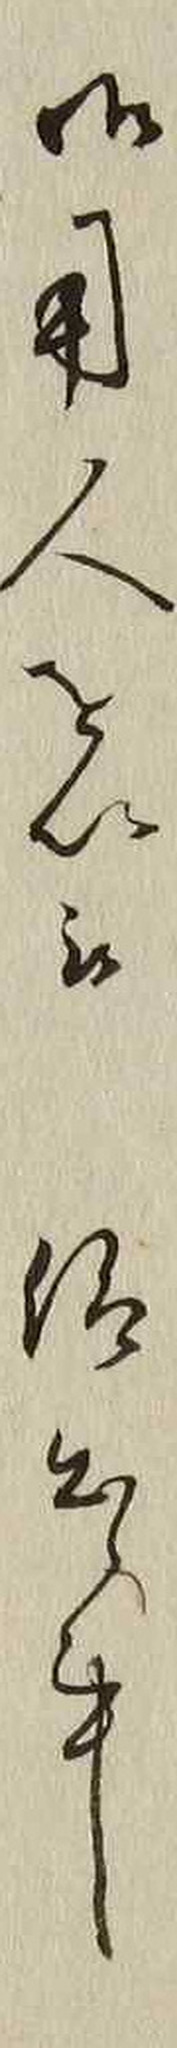御用人を以被仰出候事
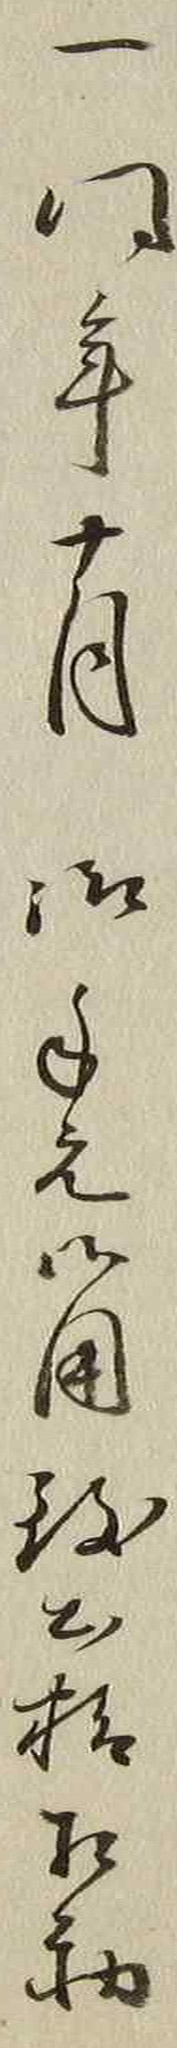一同年十月御手元御用致出精相勤
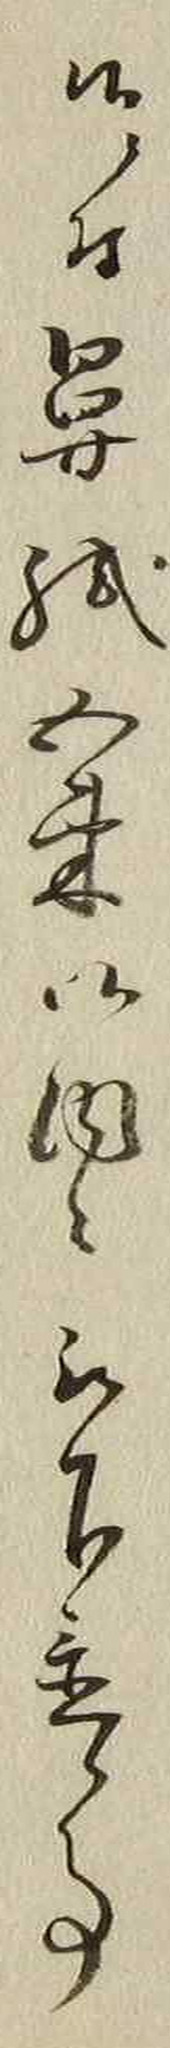候ニ付鼻紙五束御内々被下置候事
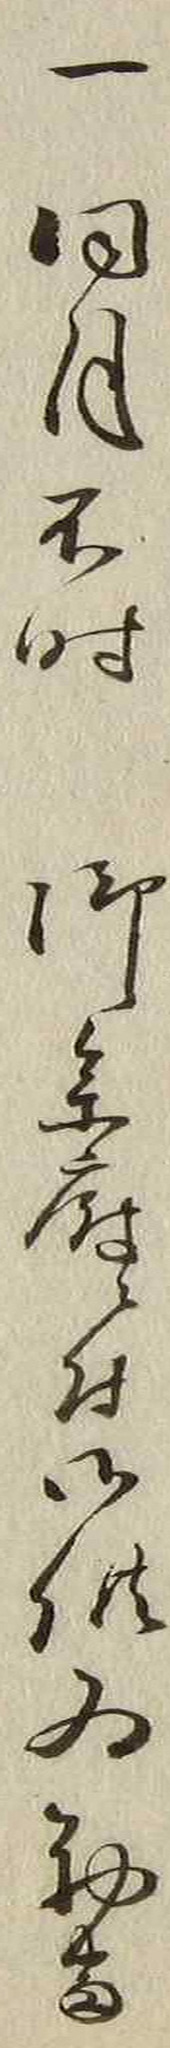一同月不時御参府ニ付御供為勤番
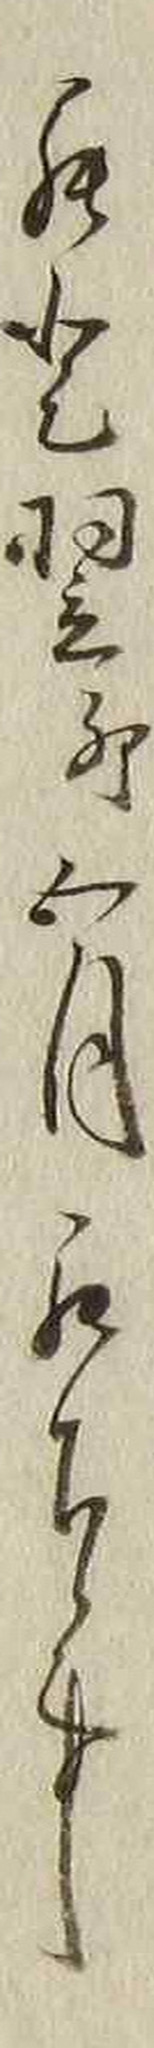罷登翌卯五月罷下候事
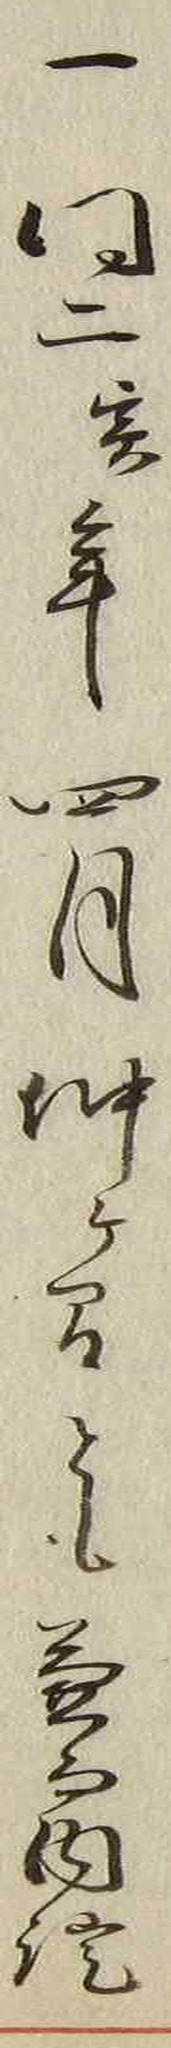一同二亥年四月仲ケ間とも兼而内証
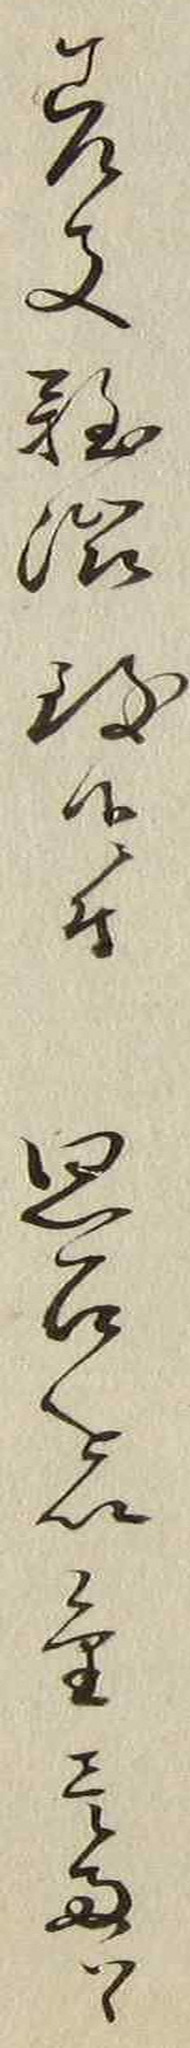差支難渋致候ニ付思召を以金壱両ツヽ
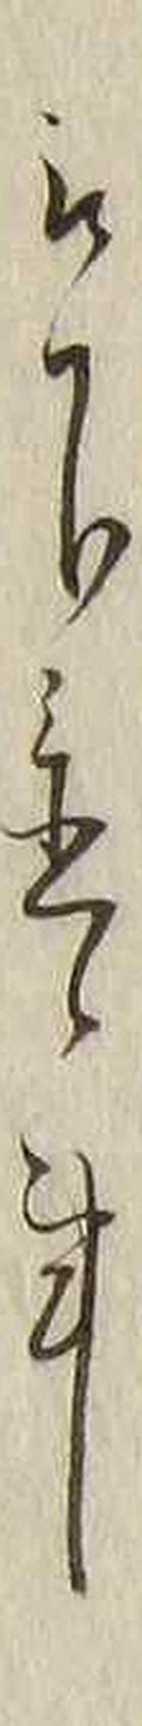被下置候事
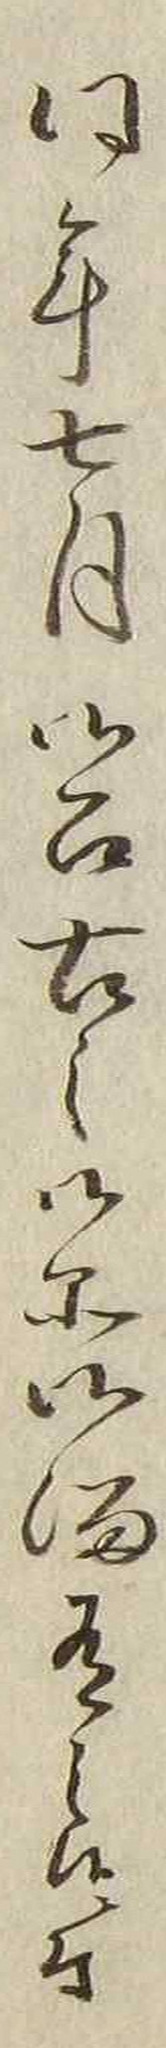一同年七月御召古之御品御溜有之候ニ付
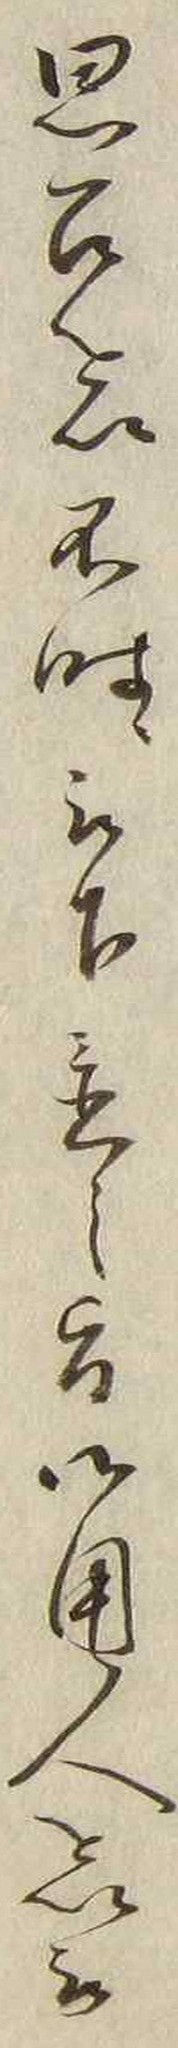思召を以不時ニ被下置之旨御用人を以被

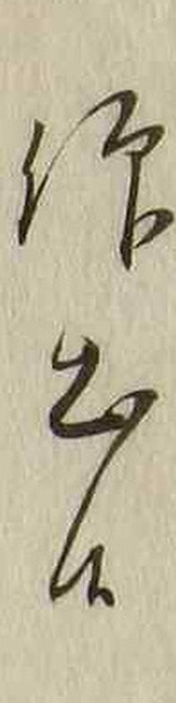仰出候
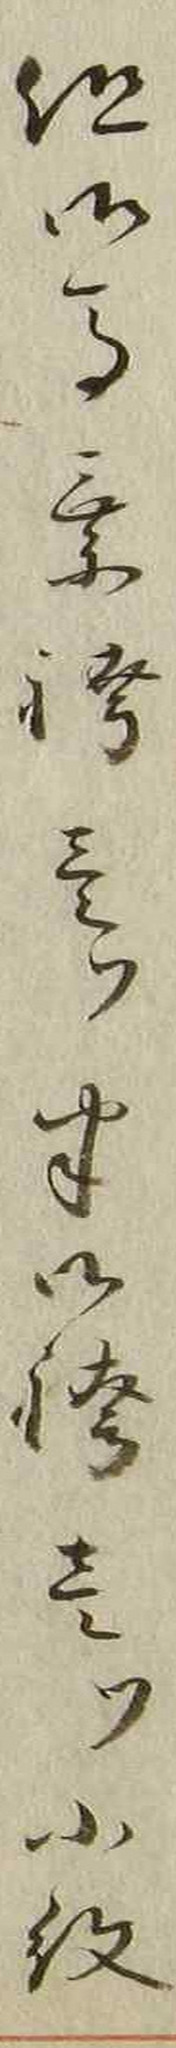但御馬乗袴壱ツ半御袴壱ツ小紋
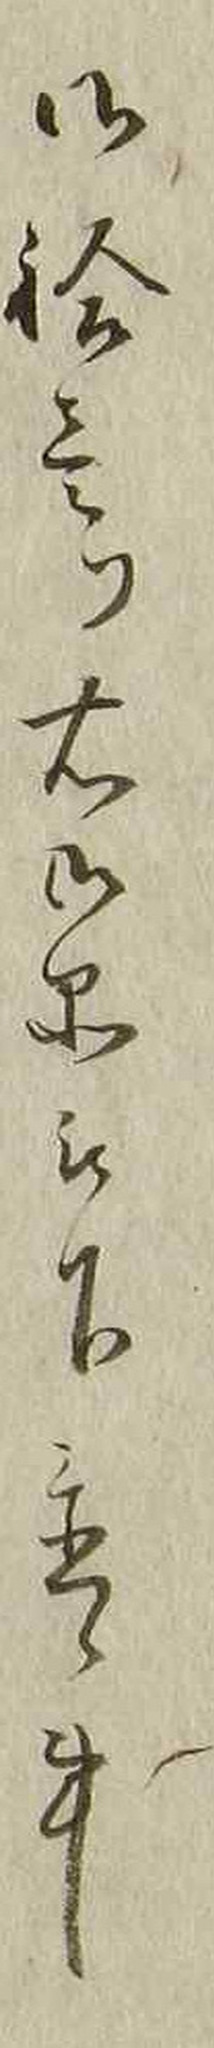御袷壱ツ右御品被下置候事
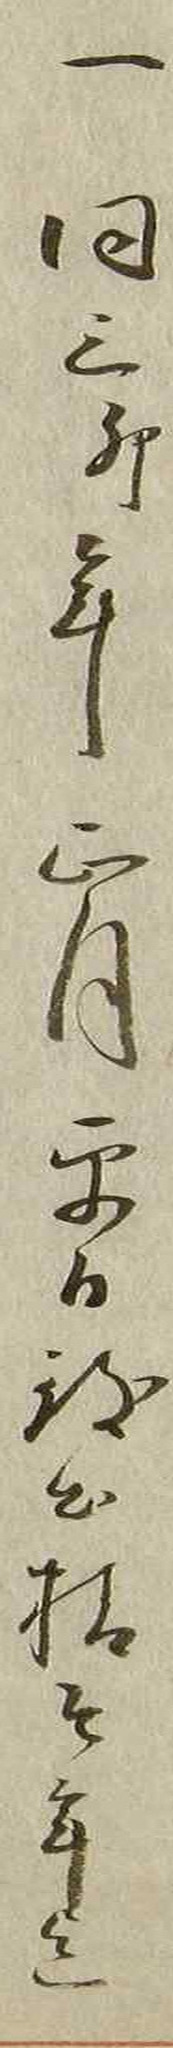一同三卯年正月平日致出精今年迄
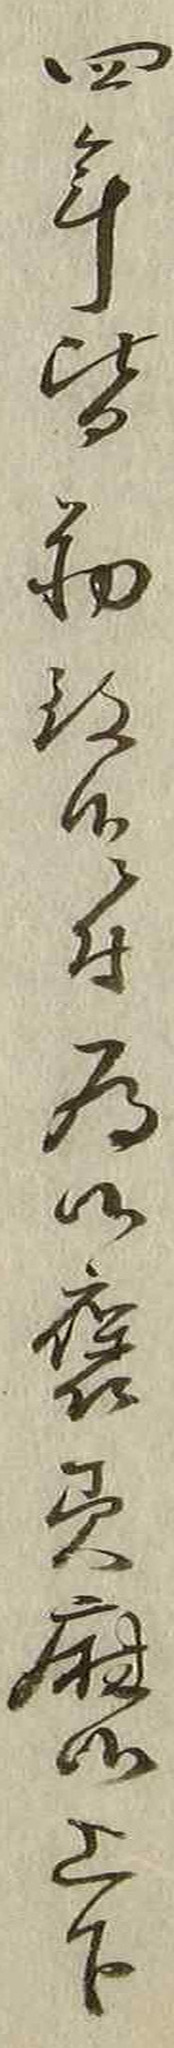四年皆勤致候ニ付為御褒美麻御上下
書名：諸士系譜　巻之25　い之部25
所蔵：会津若松市立会津図書館
